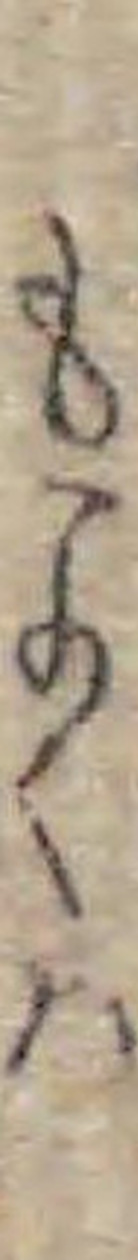もよくは
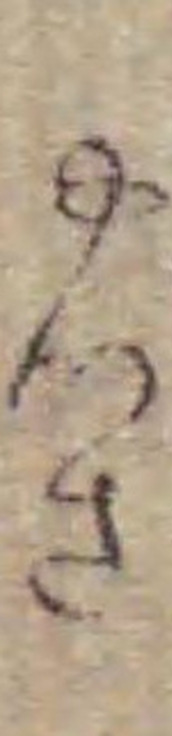やつさ
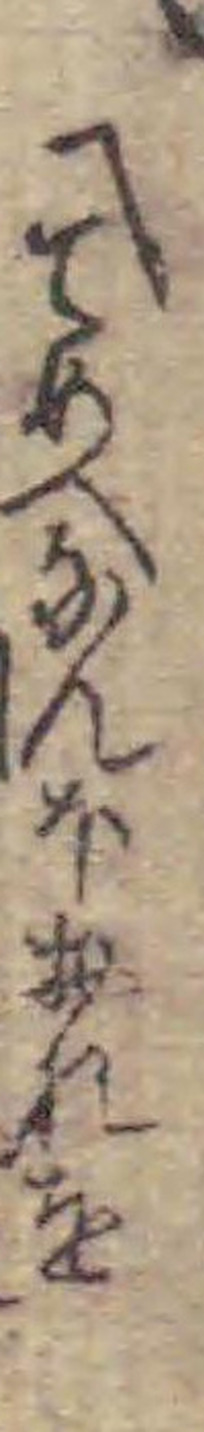〽てめへなんほおれを
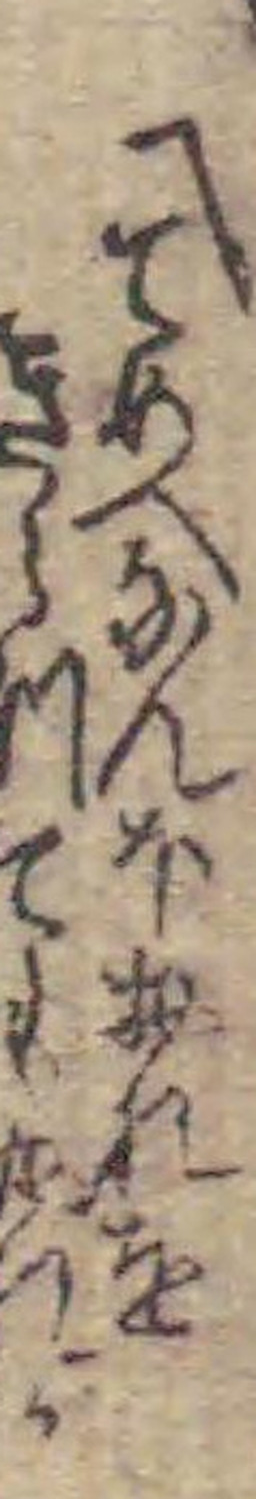きらつてもおれが
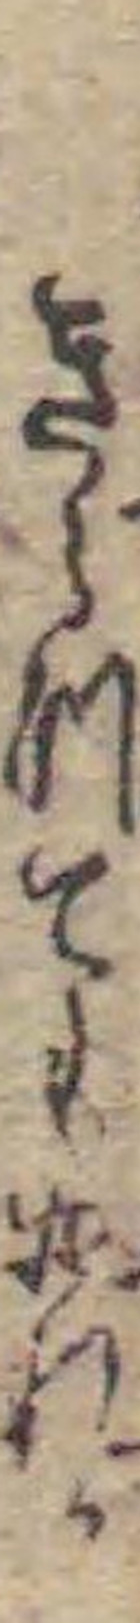きらつてもおれが
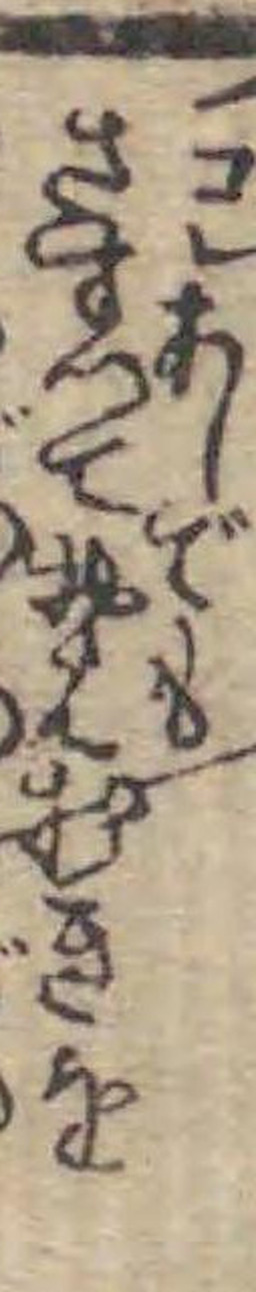さすつておはむきを
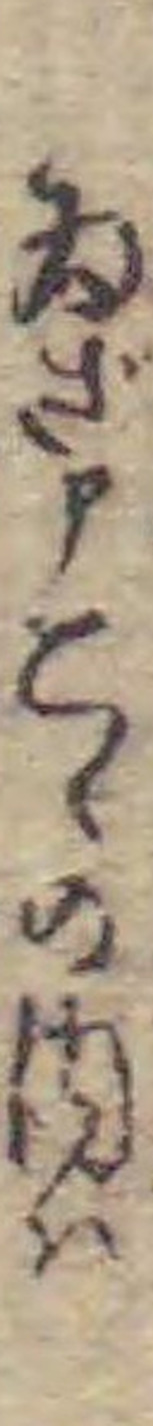ゐざァこゝの打ちは
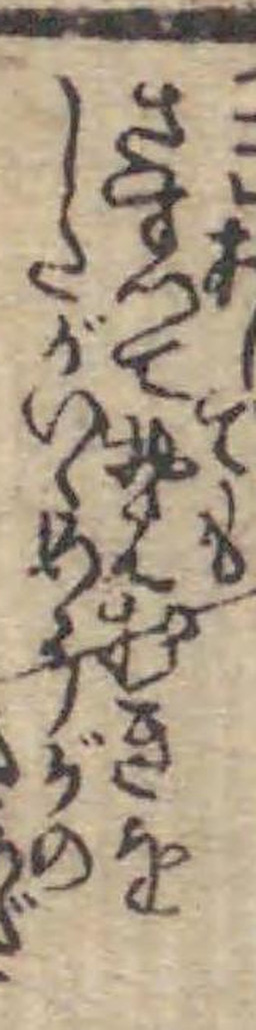さすつておはむきを
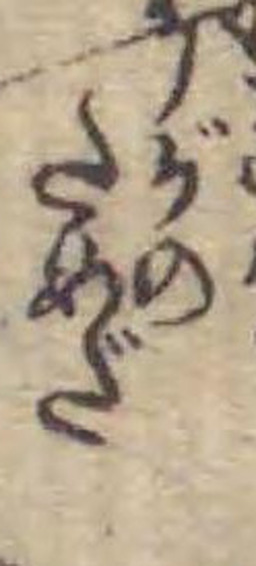ためだ
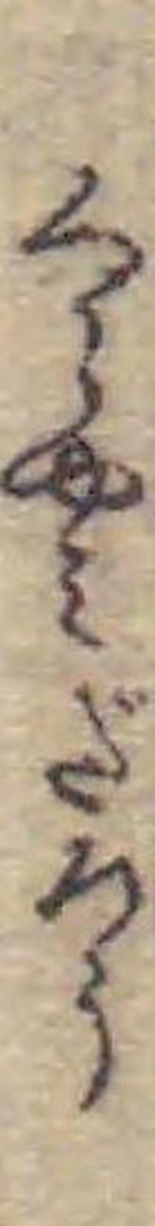くらやみだろう
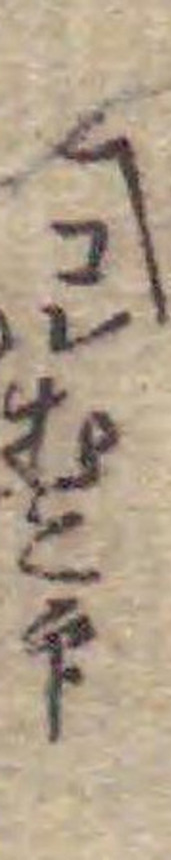〽コレむこ印
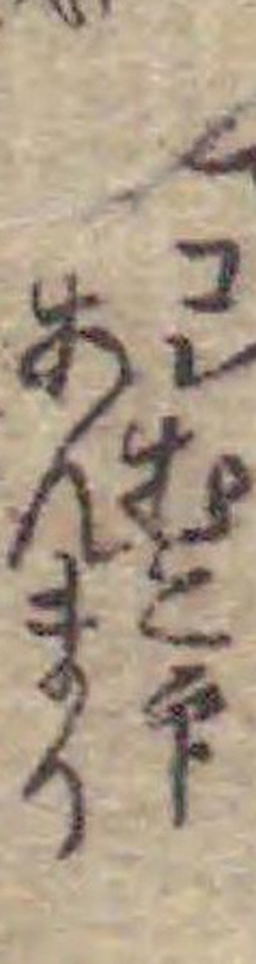あんまり
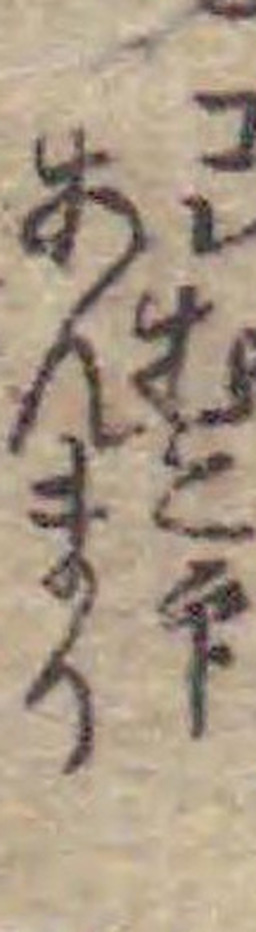あんまり
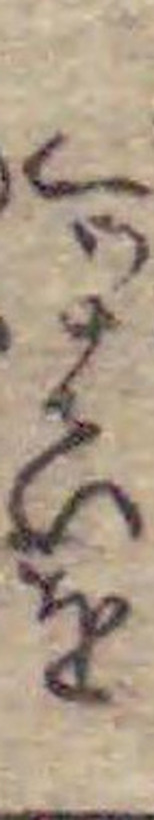一ッはいを
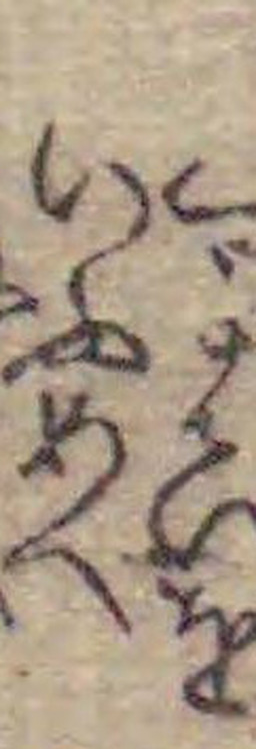いふめへ
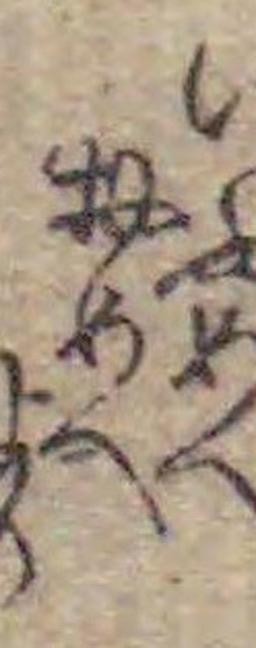おめへ
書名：新鋳小判 : 3巻
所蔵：国立国会図書館 National Diet Library, JAPAN
